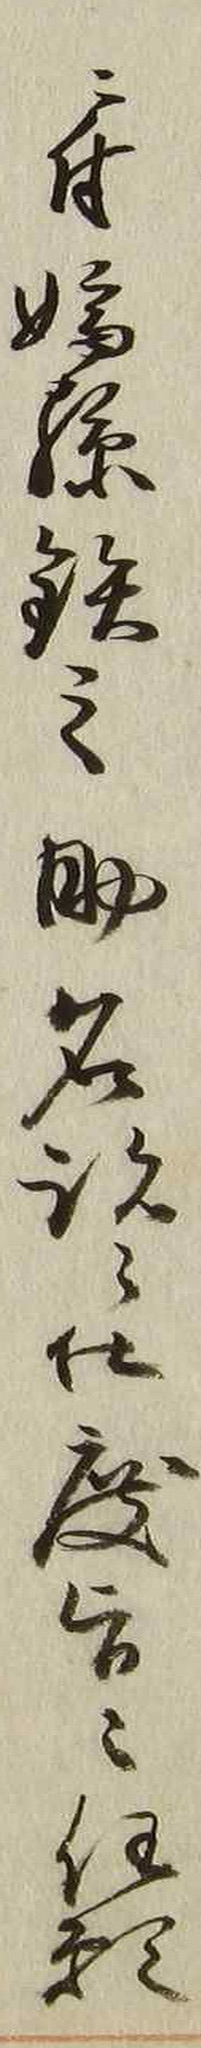ニ付嫡孫鉄之助名跡ニ仕度旨被任願
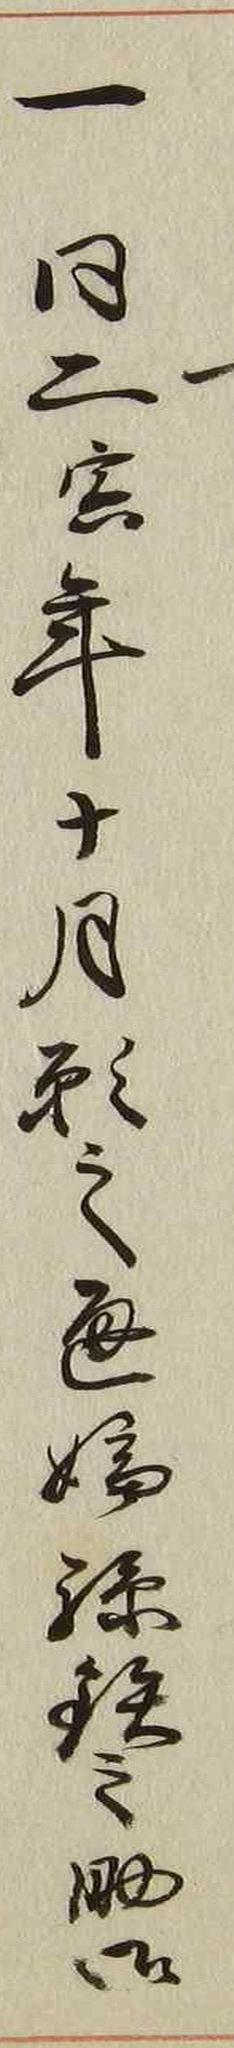一同二寅年十月願之通嫡孫鉄之助御
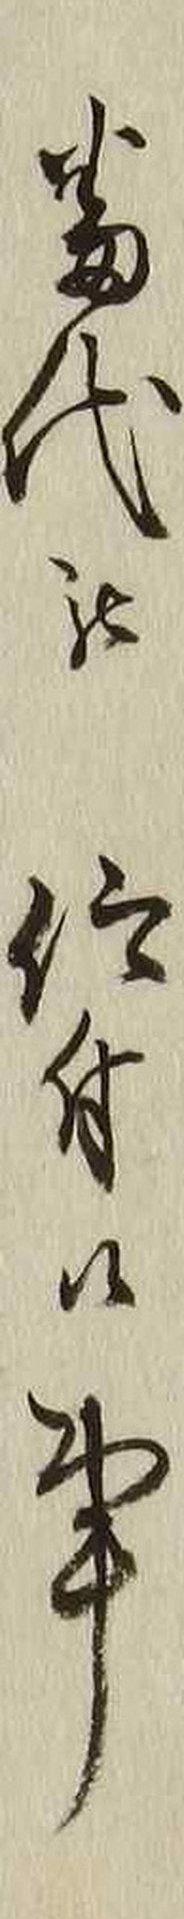番代被仰付候事
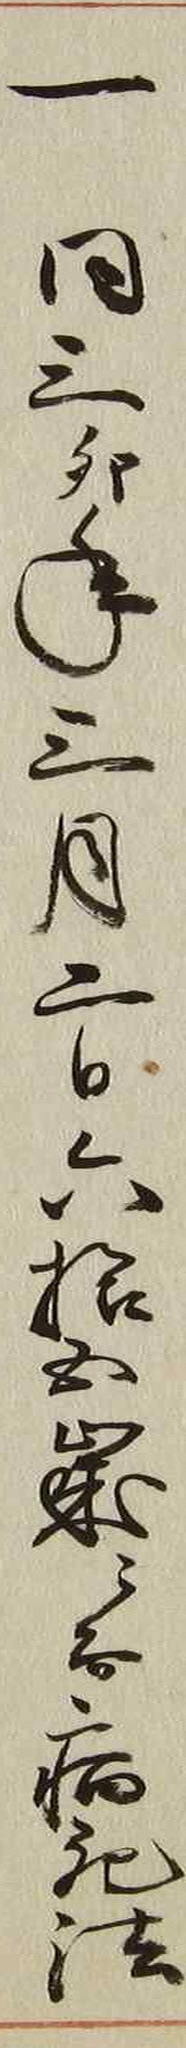一同三卯年三月二日六拾五歳ニ而病死法
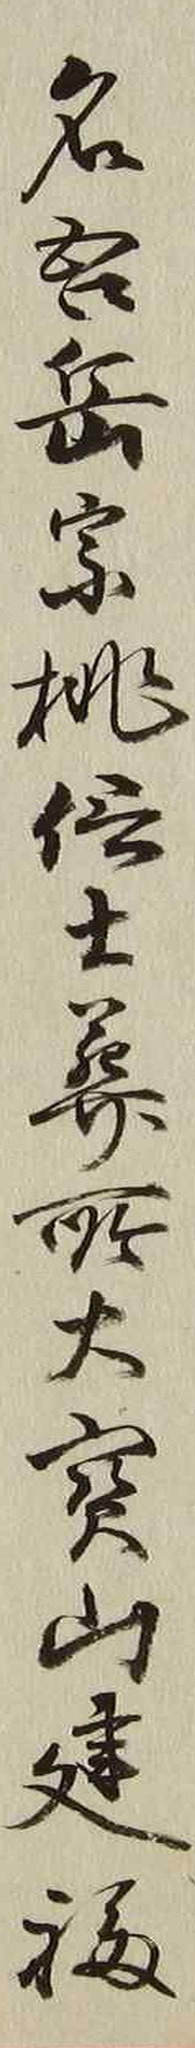名吾岳宗桃信士葬所大宝山建福
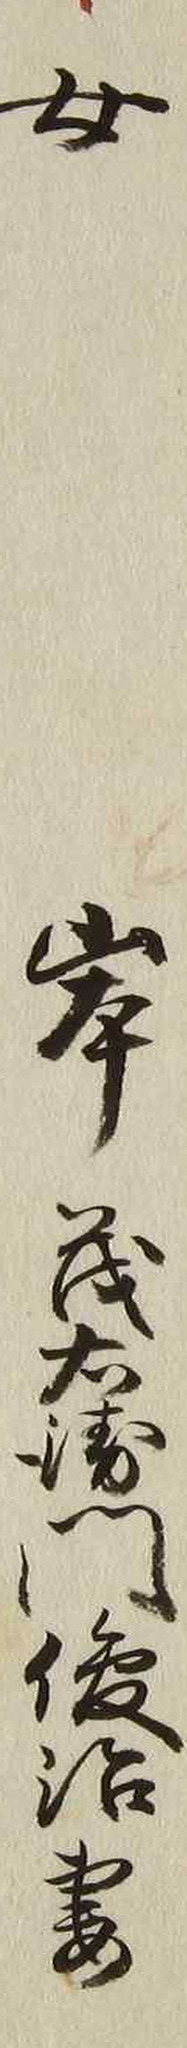女峰茂右衛門俊治妻
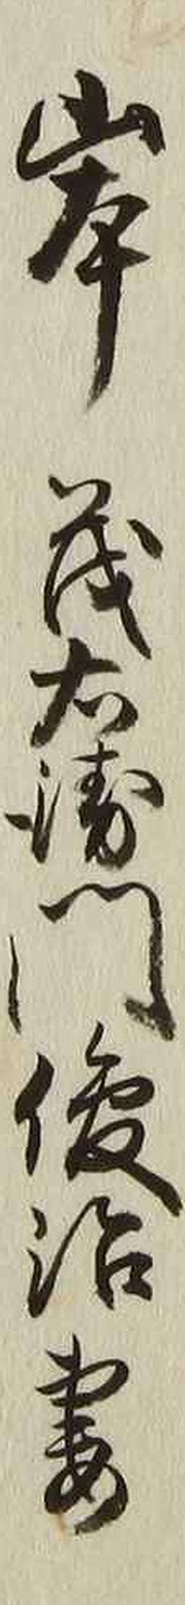女峰茂右衛門俊治妻
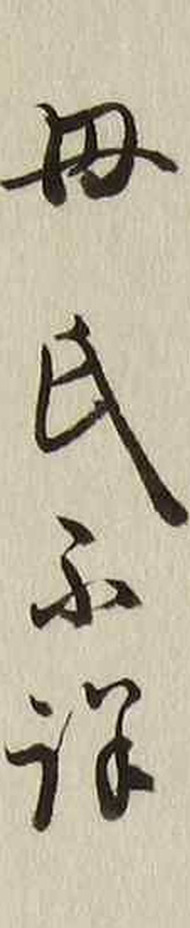母氏不詳
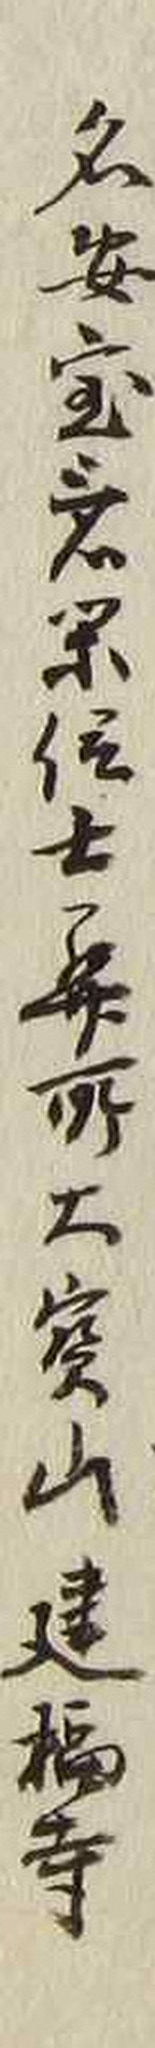名吾岳宗桃信士葬所大宝山建福
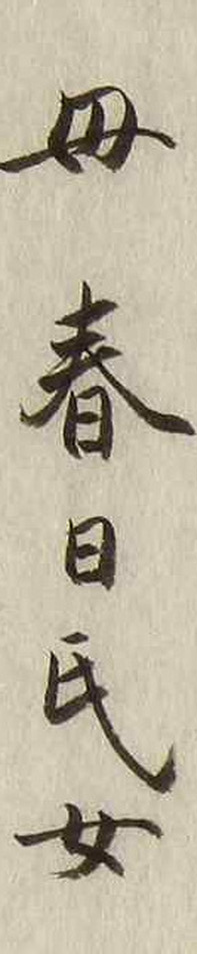母春日氏女

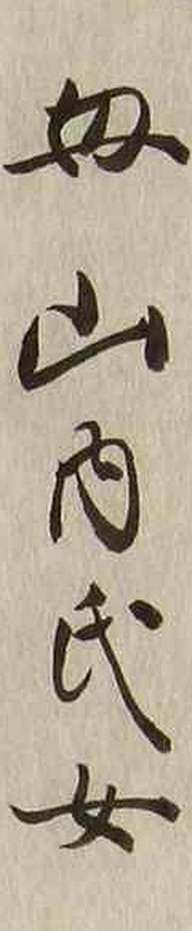母山内氏女
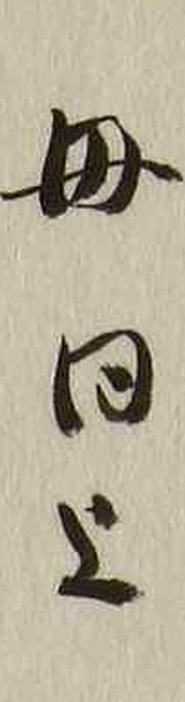母同上
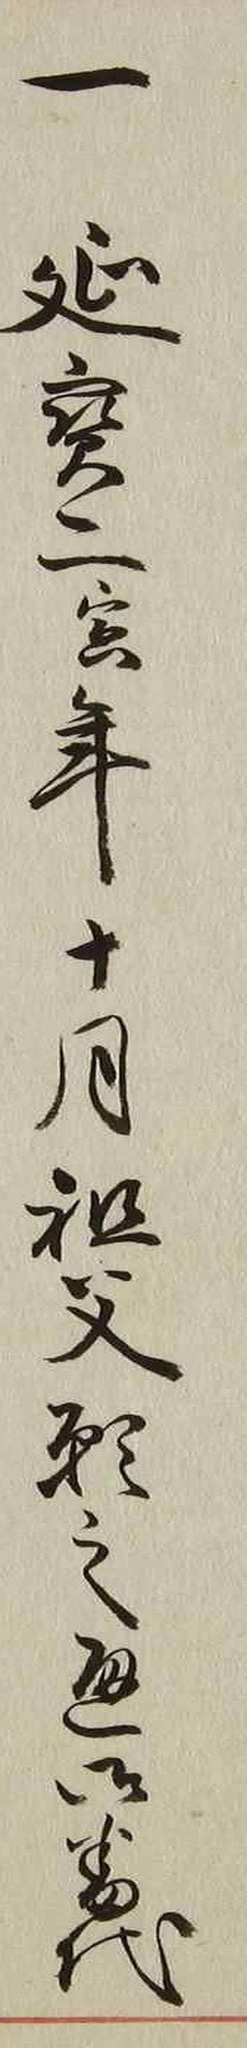一延宝二寅年十月祖父願之通御番代
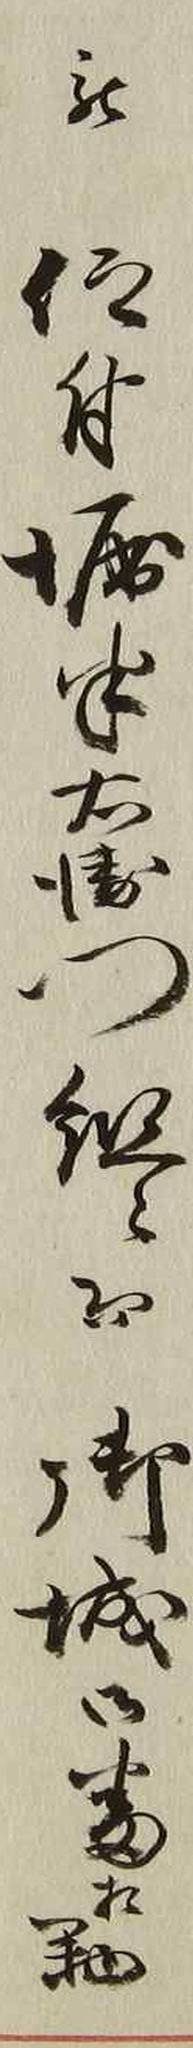被仰付堀半右衛門組ニ而御城御番相勤
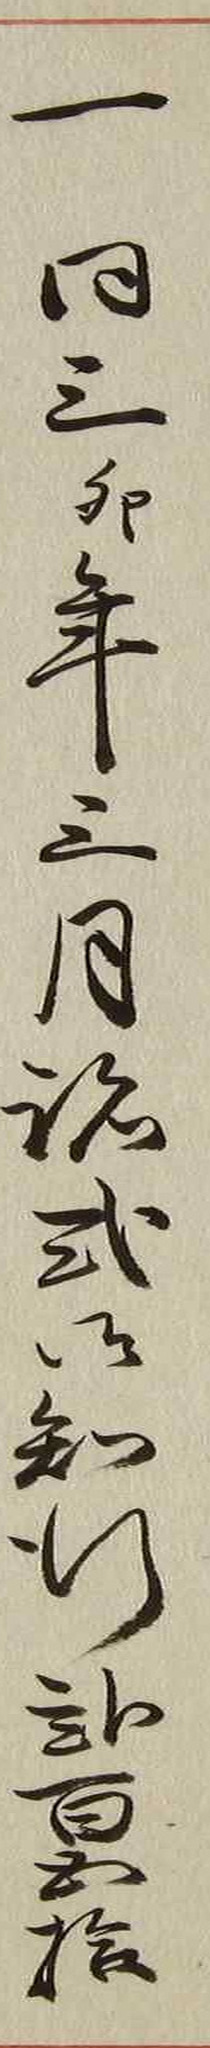一同三卯年三月跡式御知行弐百五拾
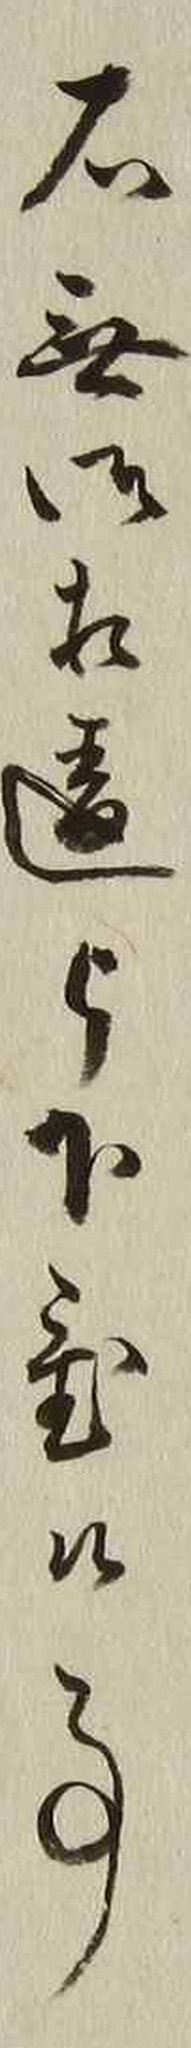石無御相違被下置候事
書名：諸士系譜　巻之15　い之部15
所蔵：会津若松市立会津図書館
